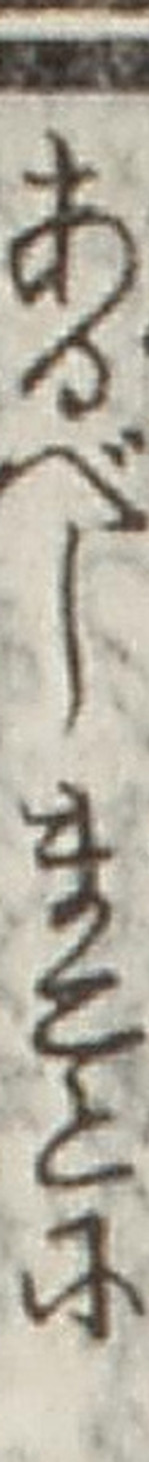あるべしまことに
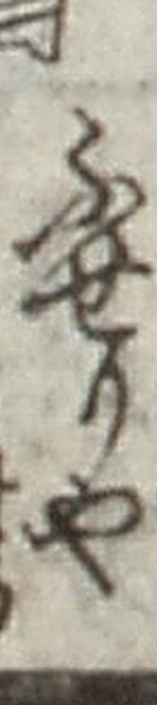ふせりや
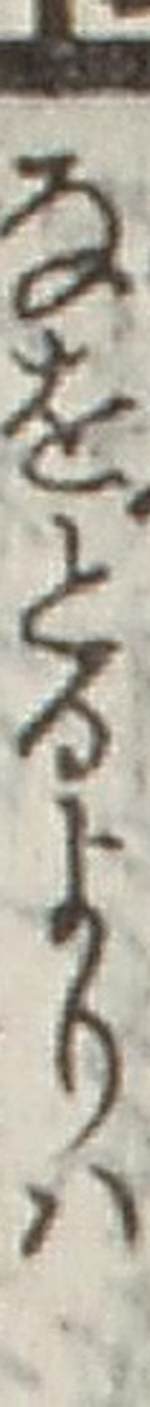なをとるよりは
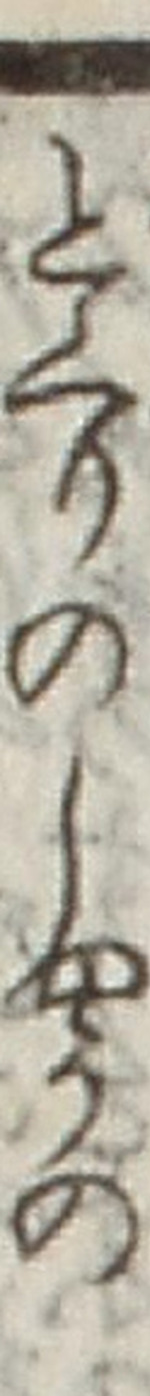とくりのしやうの
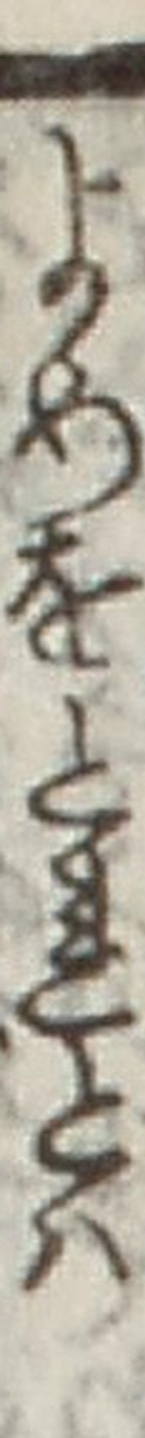よめをとれとは
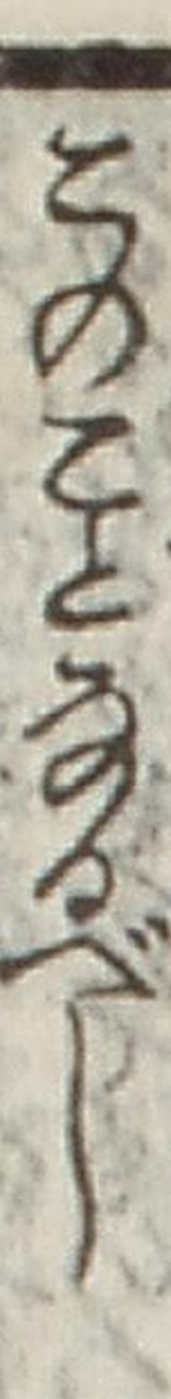このことなるべし
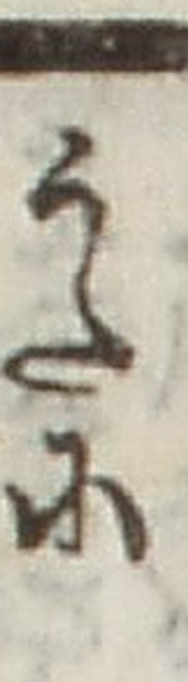うたに
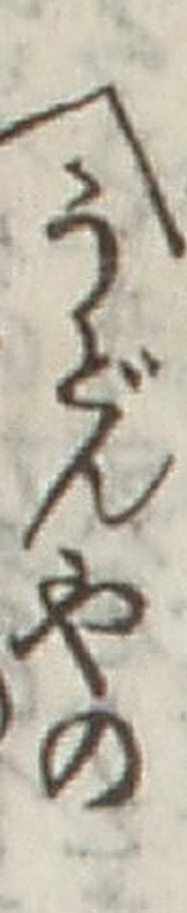〽うどんやの
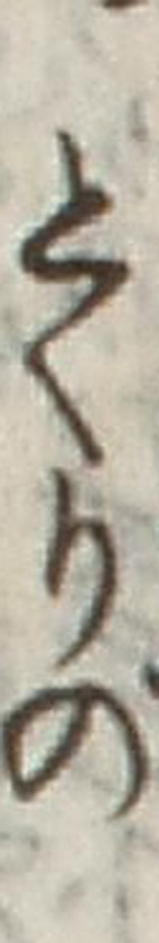とくりの
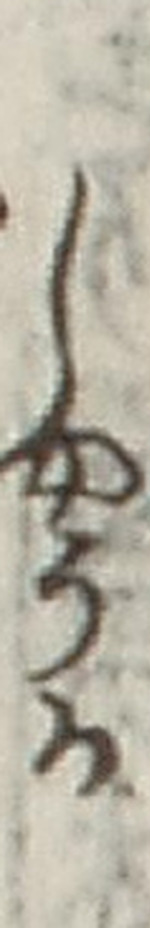しやうが
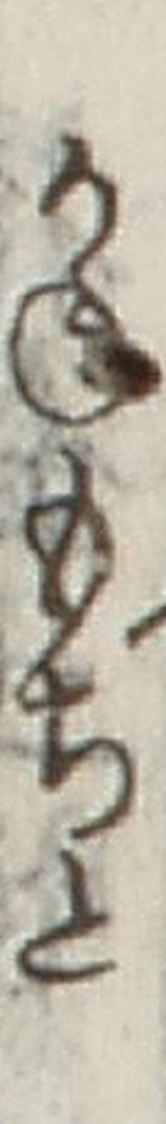かねもちと
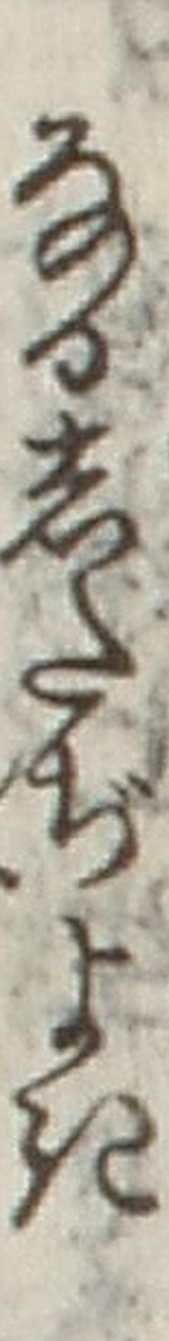なるしたぢよき
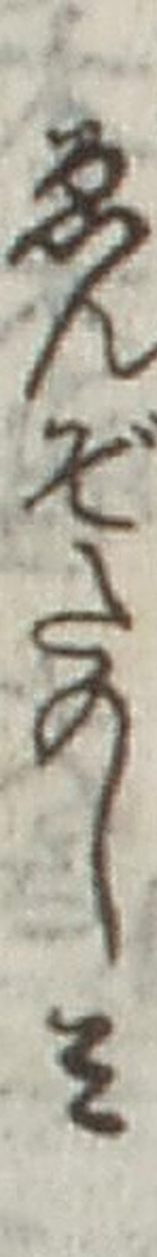ゑんぞたのしき

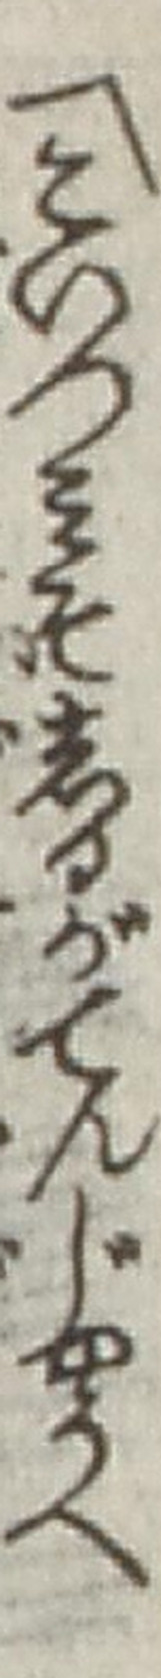〽こいつみそしるがてんじやうへ
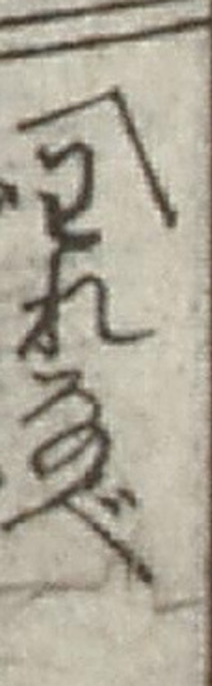〽われなべ
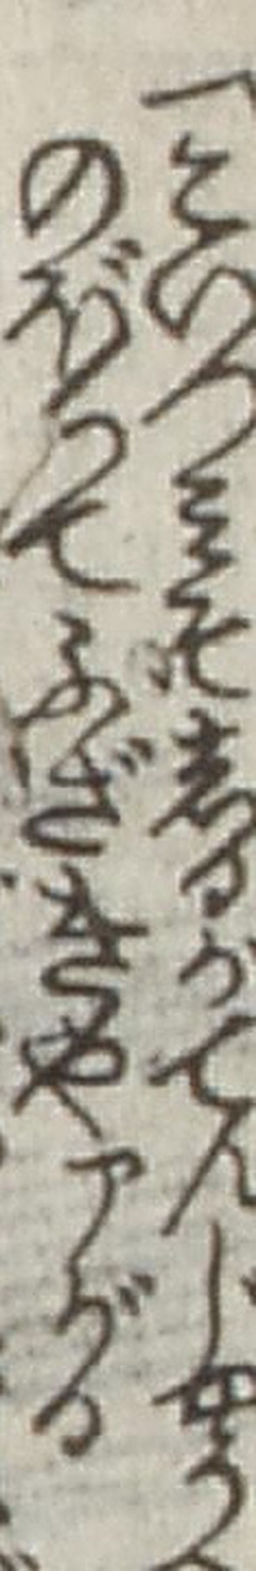のぼつてふざきやァがる
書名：三世相出雲當座帳　上下冊
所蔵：東京大学地震研究所図書室 Earthquake Research Institute Library, The University of Tokyo, JAPAN
